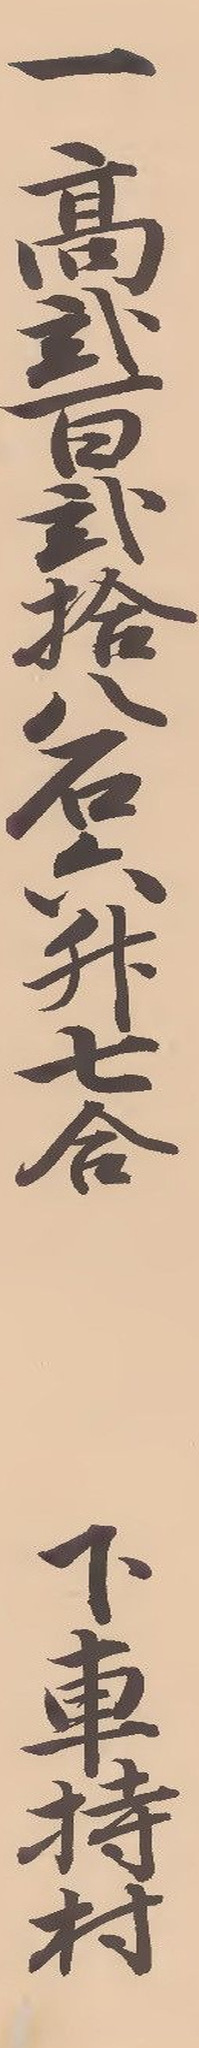一高弐百弐拾八石六升七合下車持村

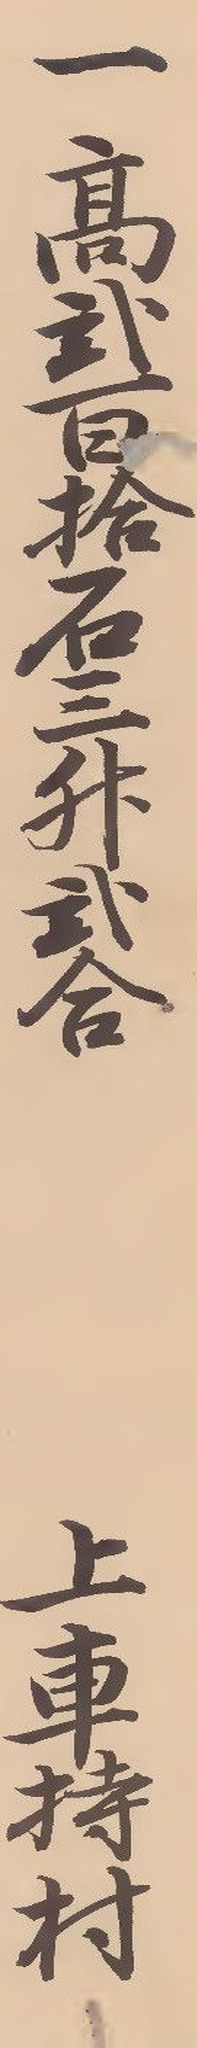一高弐百拾石三升弐合上車持村
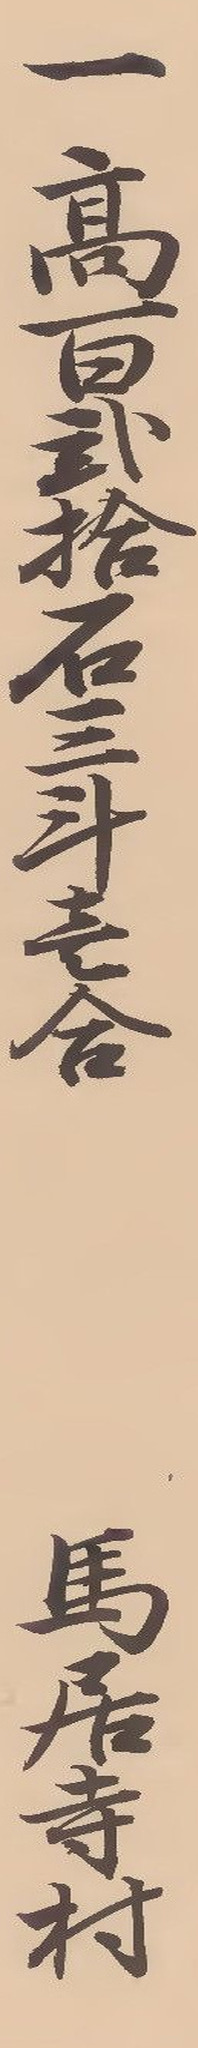一高百弐拾石三斗壱合馬居寺村
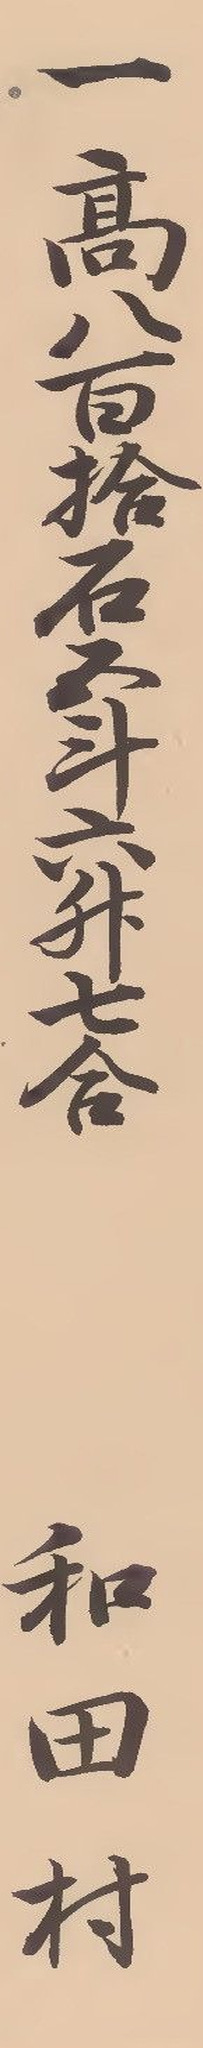一高八百拾石五斗六升七合和田村
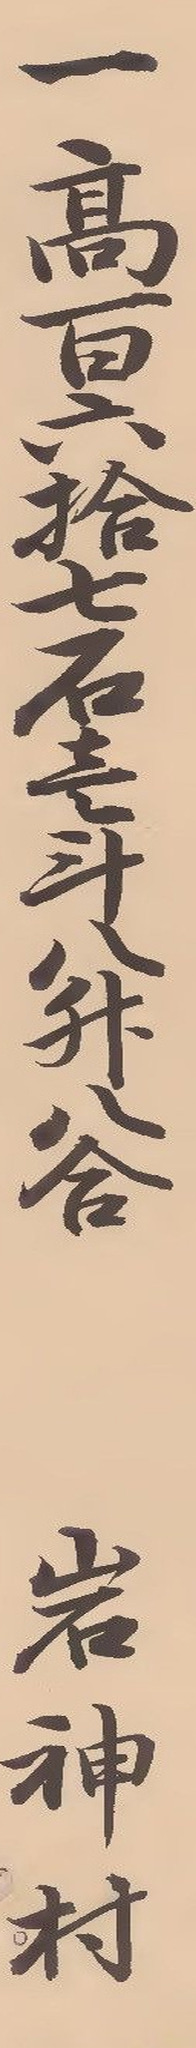一高百六拾七石壱斗八升八合岩神村
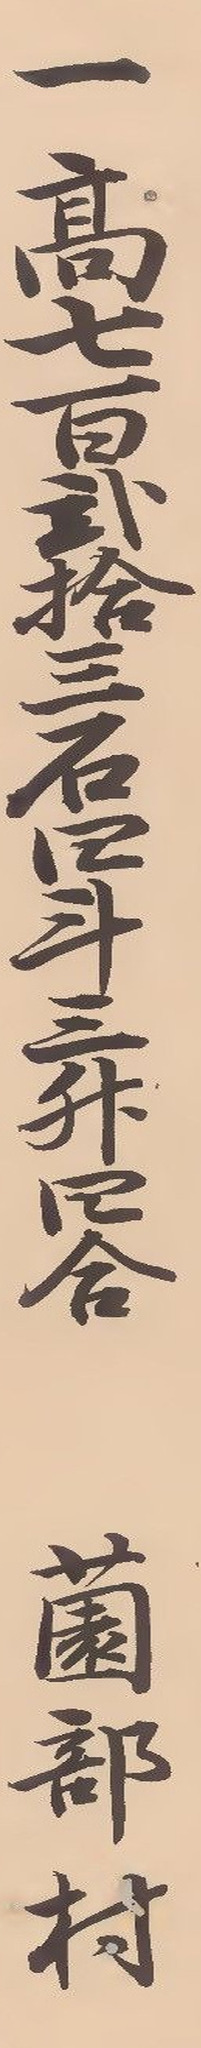一高七百弐拾三石四斗三升四合薗部村
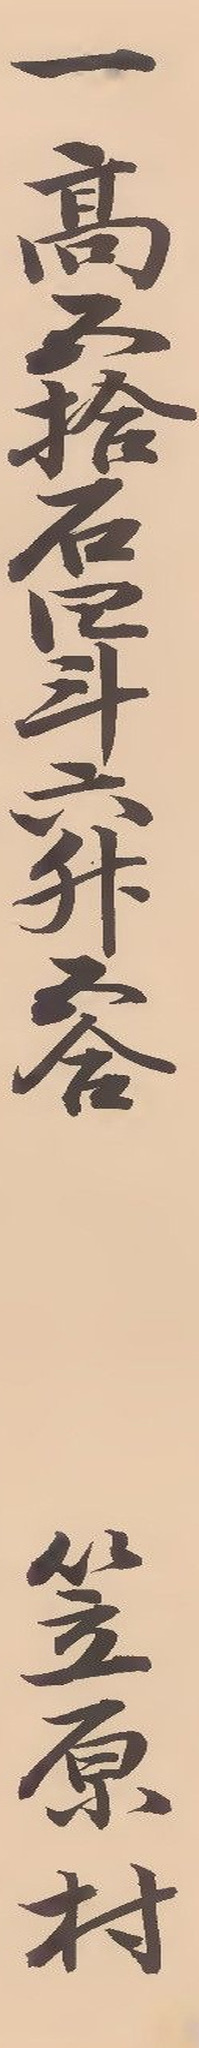一高五拾石四斗六升五合笠原村
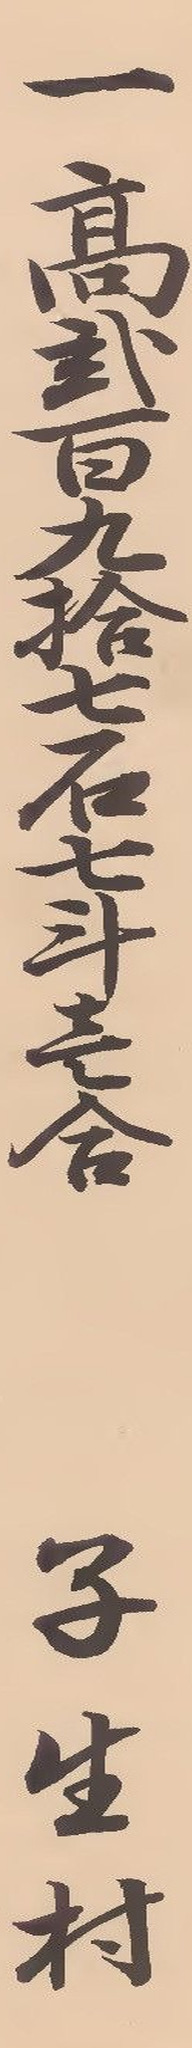一高弐百九拾七石七斗壱合子生村
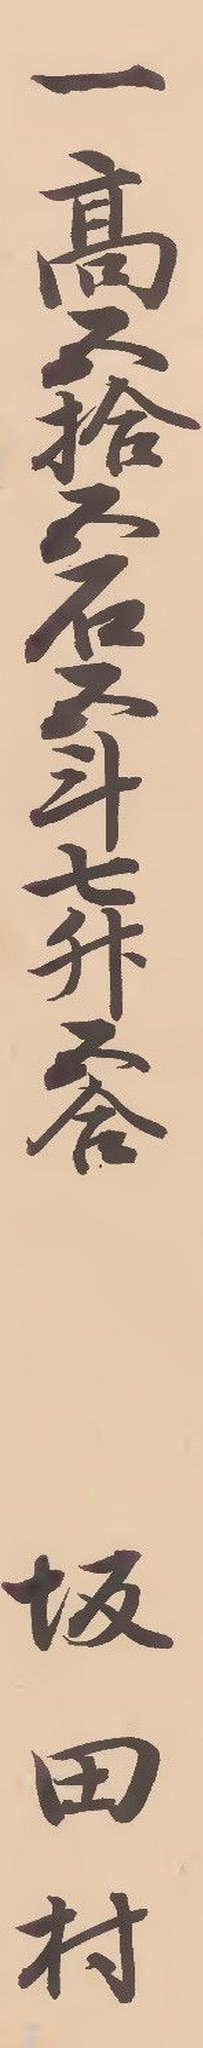一高五拾五石五斗七升五合坂田村

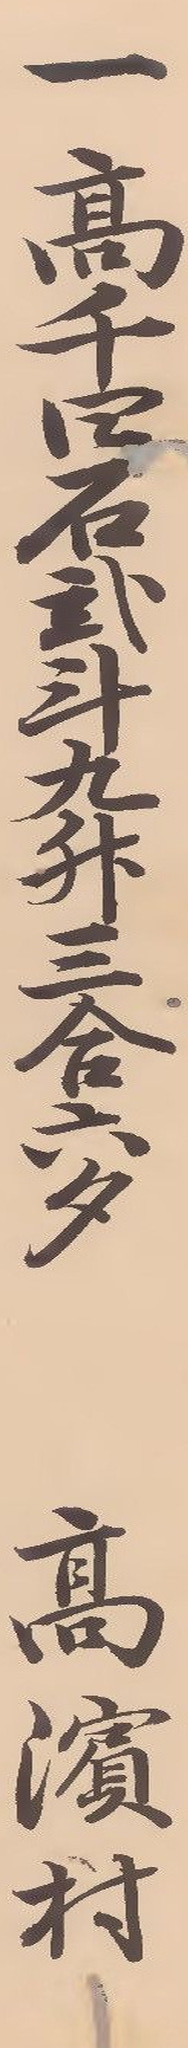一高千四石弐斗九升三合六勺高浜村
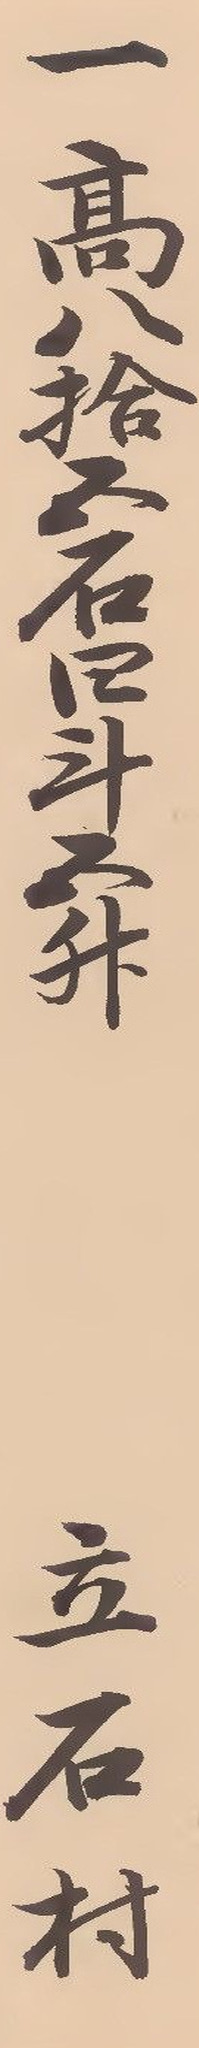一高八拾五石四斗五升立石村
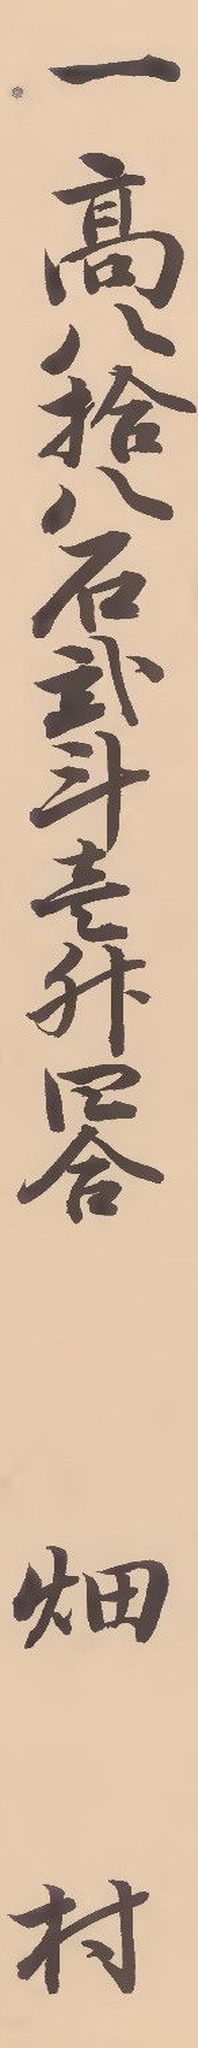一高八拾八石弐斗壱升四合畑村
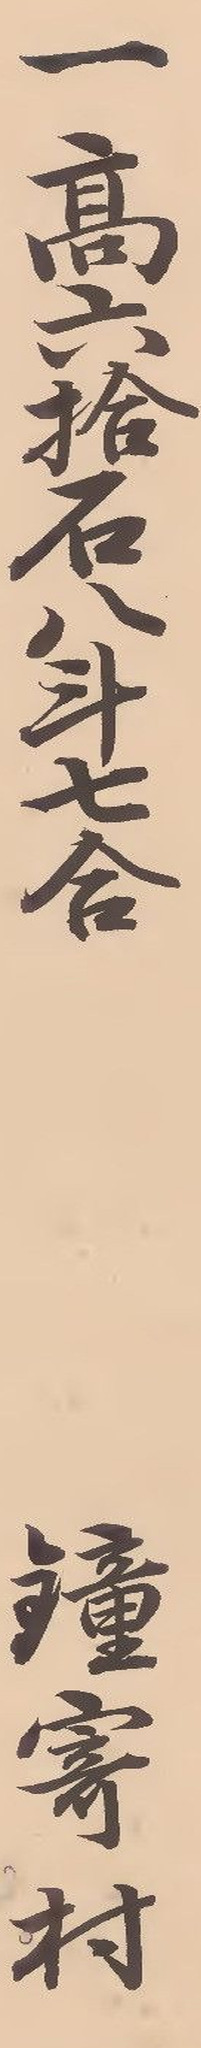一高六拾石八斗七合鐘寄村
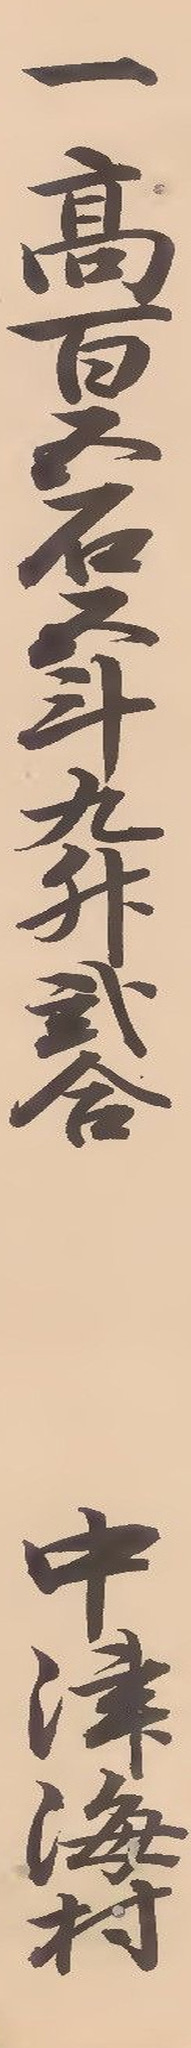一高百五石五斗九升弐合中津海村
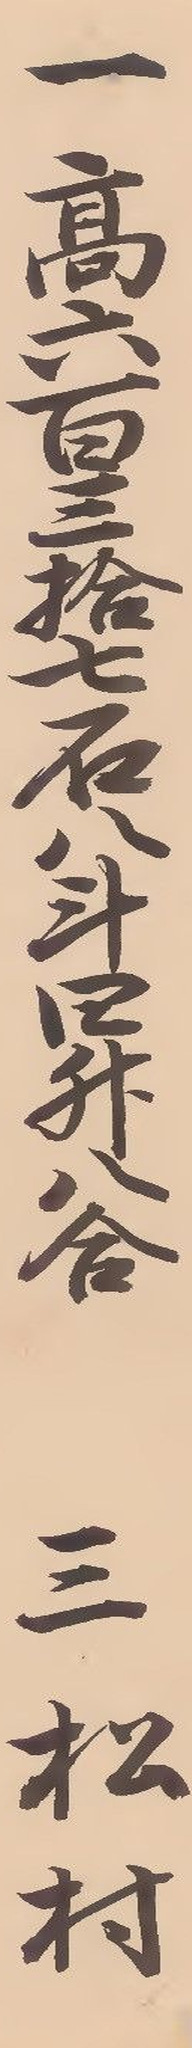一高六百三拾七石八斗四升八合三松村
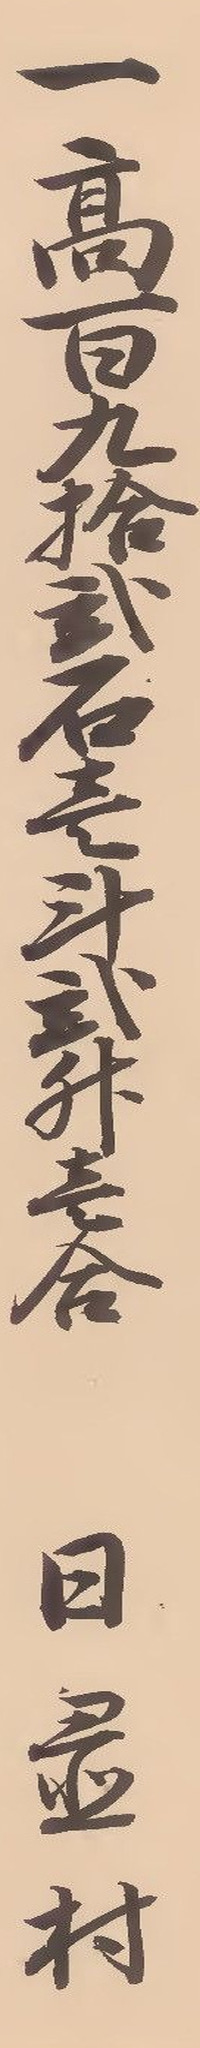一高百九拾弐石壱斗弐升壱合日置村
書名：若狭国郷帳
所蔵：国立公文書館 National Archives of Japan
